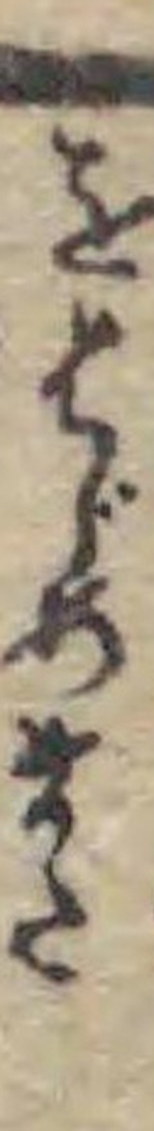をはじめまた
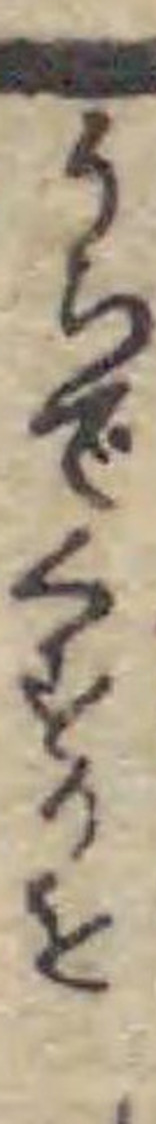うちでくすりを
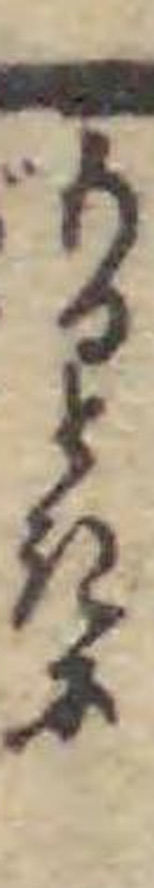もるときに
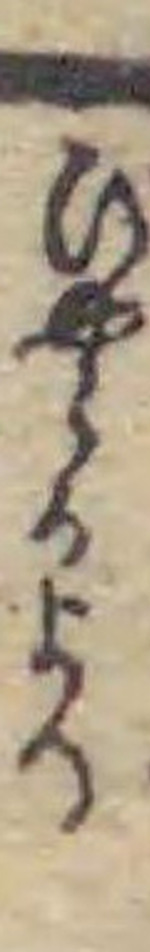びやうかより
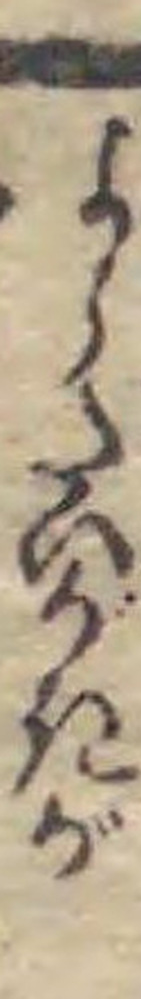ようたいがきが
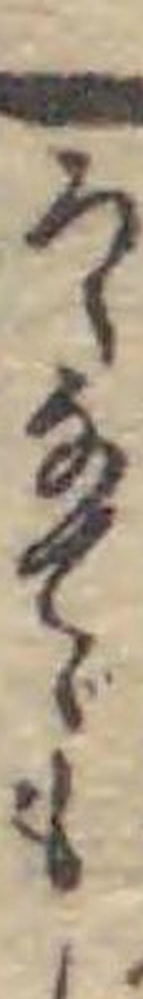ろくなてゞも
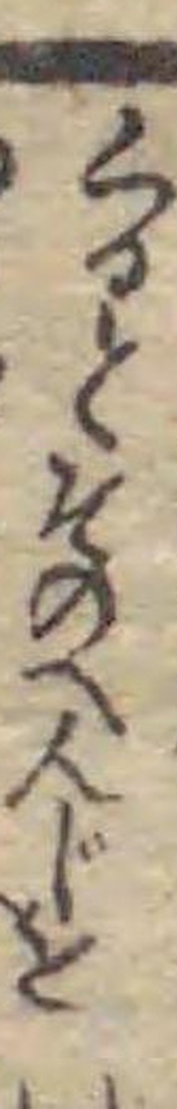くるとそのへんじを
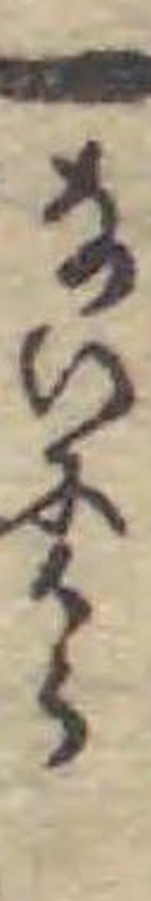ないにから
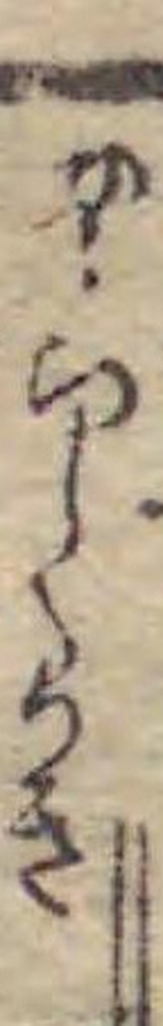やうらしくかき
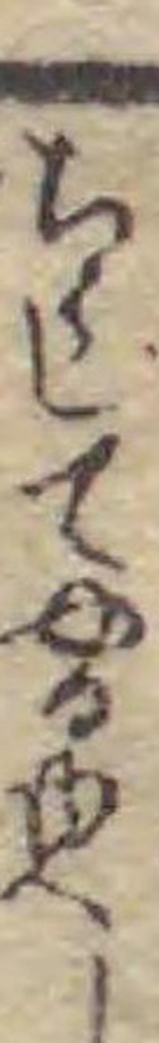ちらしてやるゆへ
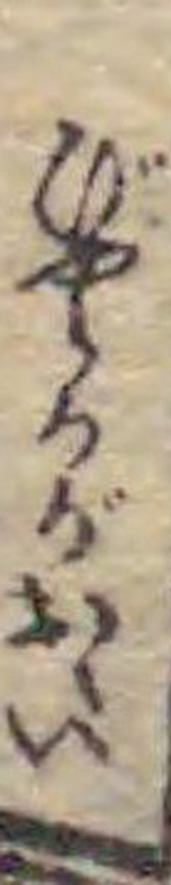びやうかがおゝい
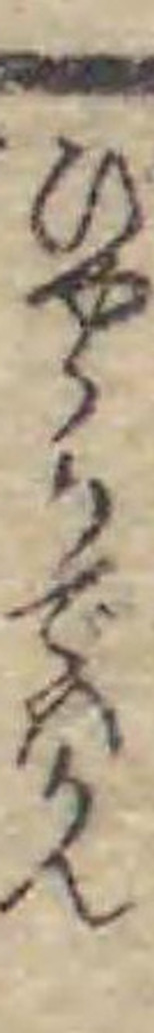びやうかではかん
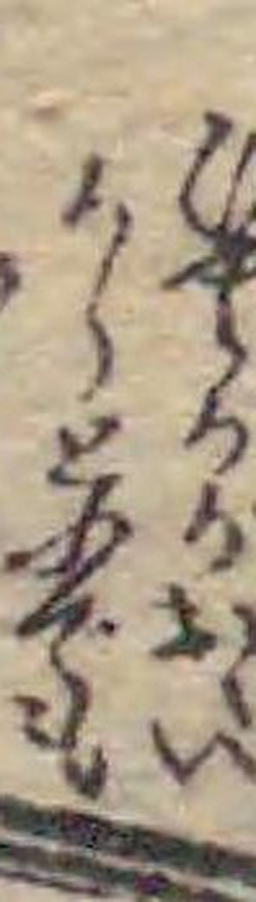からとふでも
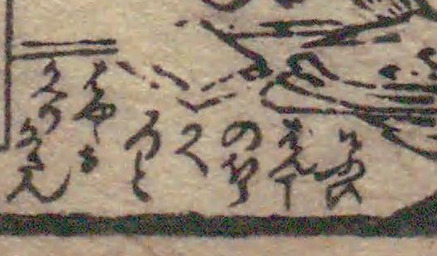これは
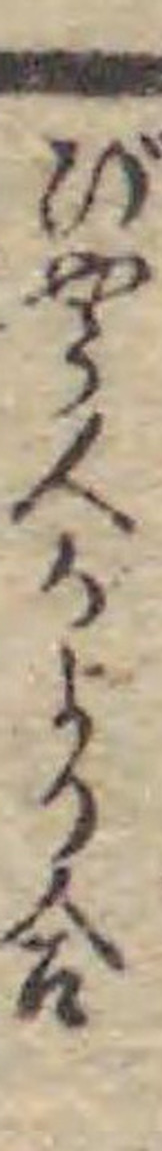びやう人かより合
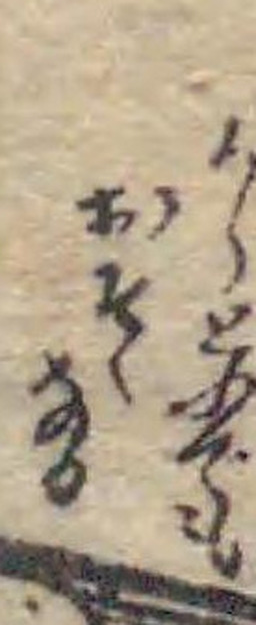おそくなる
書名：紙屑身上噺 : 3巻
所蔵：国立国会図書館 National Diet Library, JAPAN
